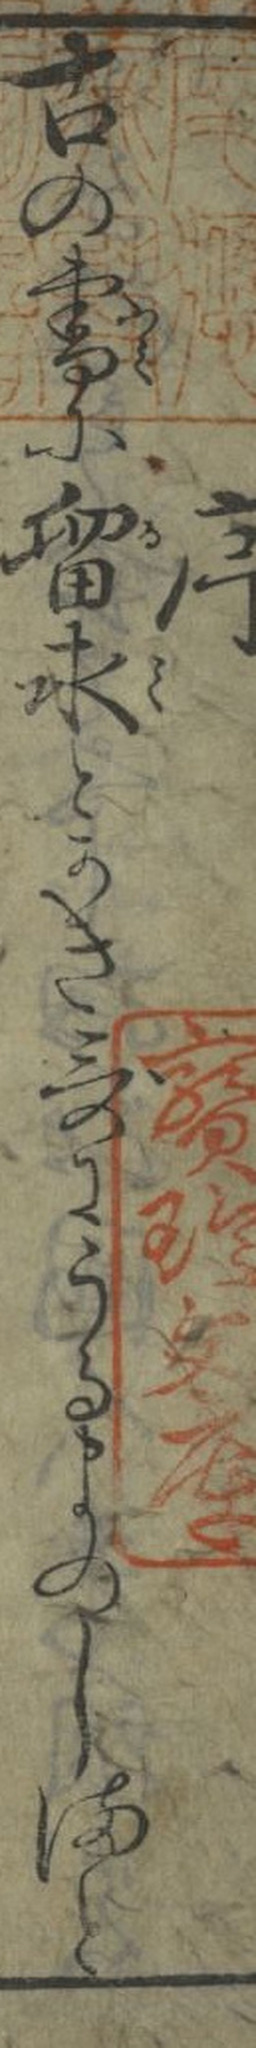古の書に留求とかき哥にうるまのしまと
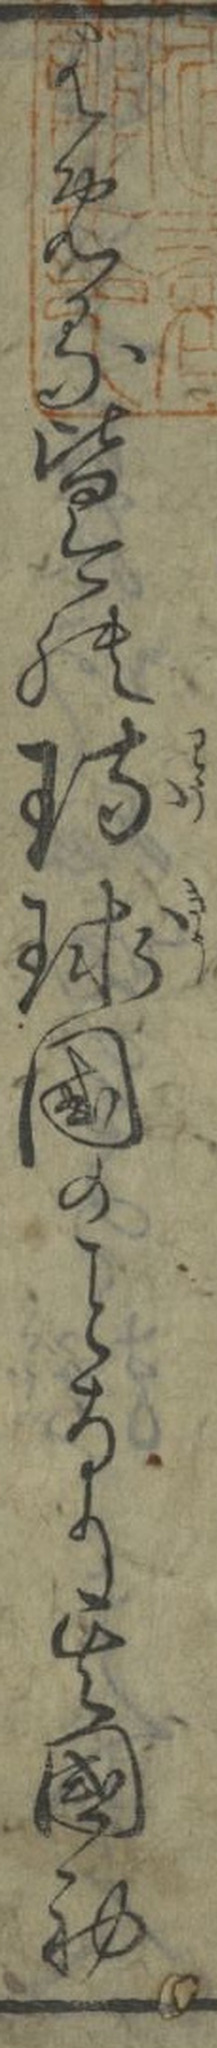よめる皆今の琉球國のことなり其國初
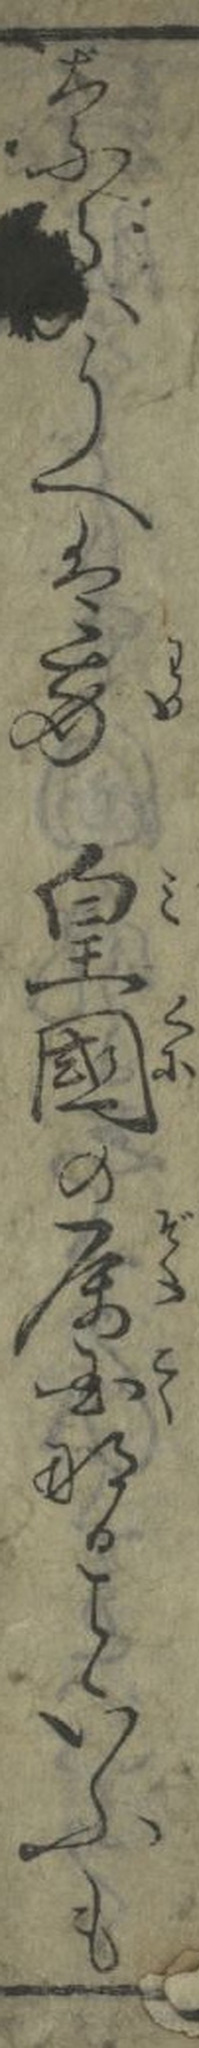なるかうへは我皇國の属国なることいふも
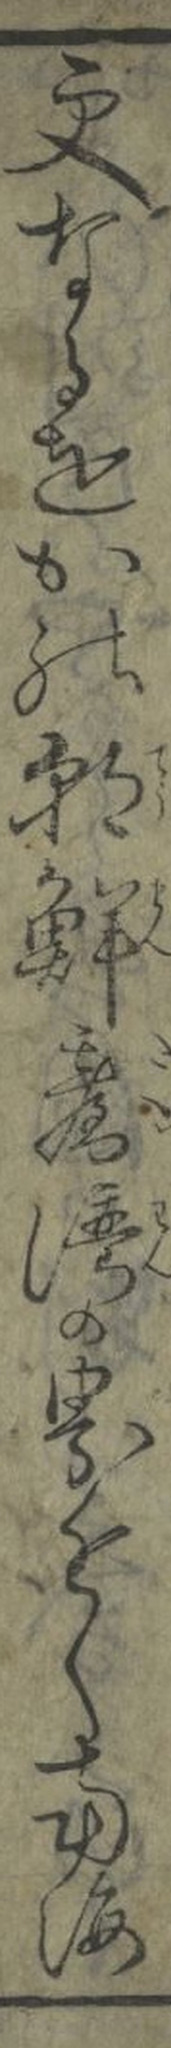更なるをかの朝鮮臺湾の界近く南海
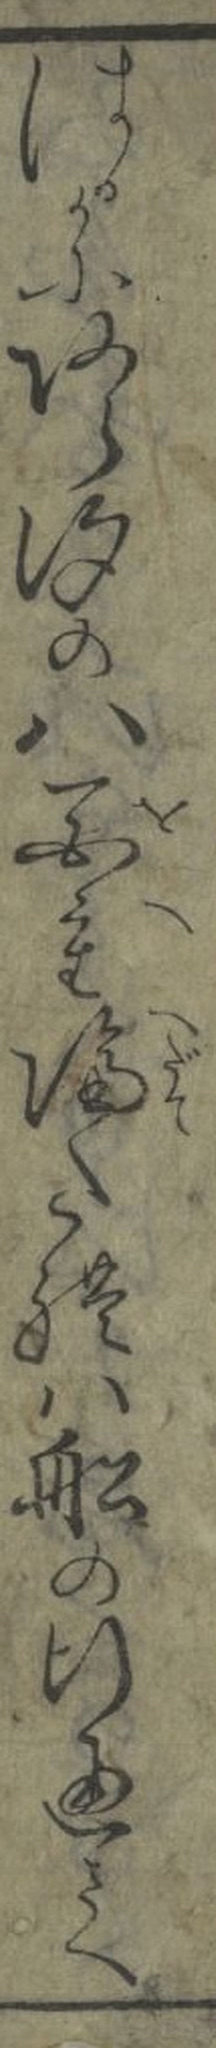はるかにあら汐の八百重隔たれは船の行通さへ

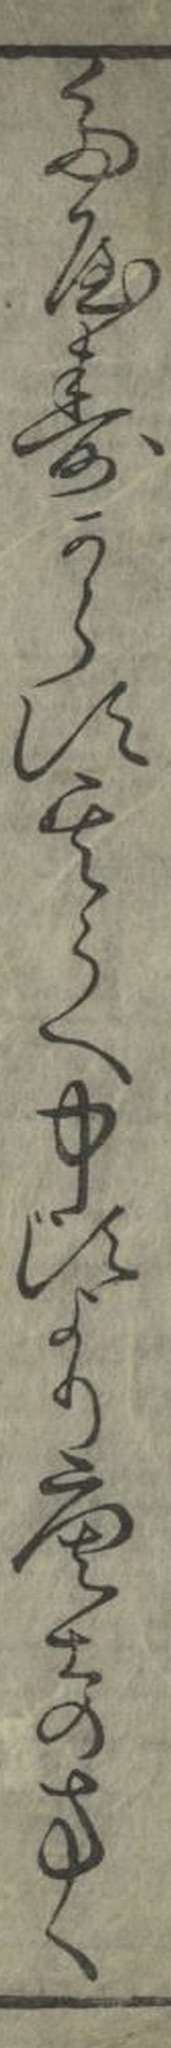たやすからす其うへ中頃より唐土のすく
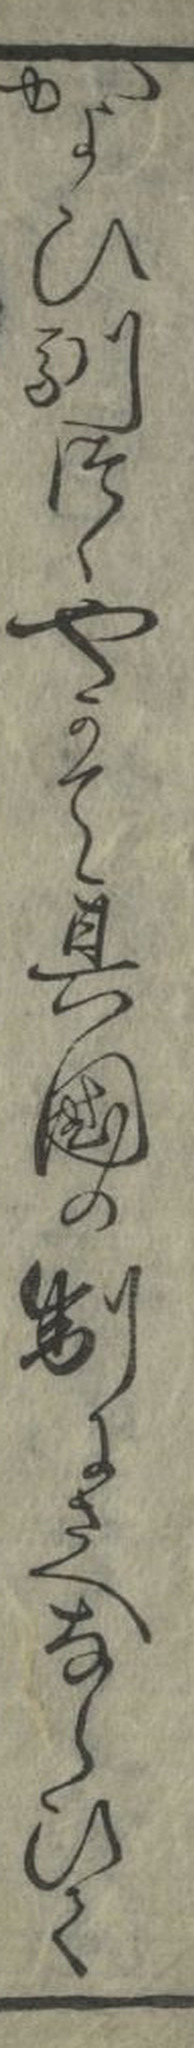かよひ馴つゝやかて其國の制にさへならひて
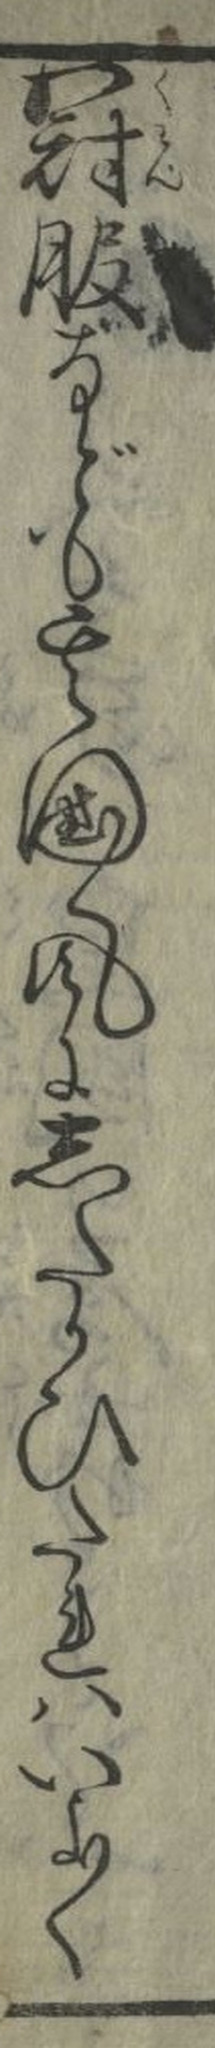冠服なども其國風にしたかひたれはいよ〳〵
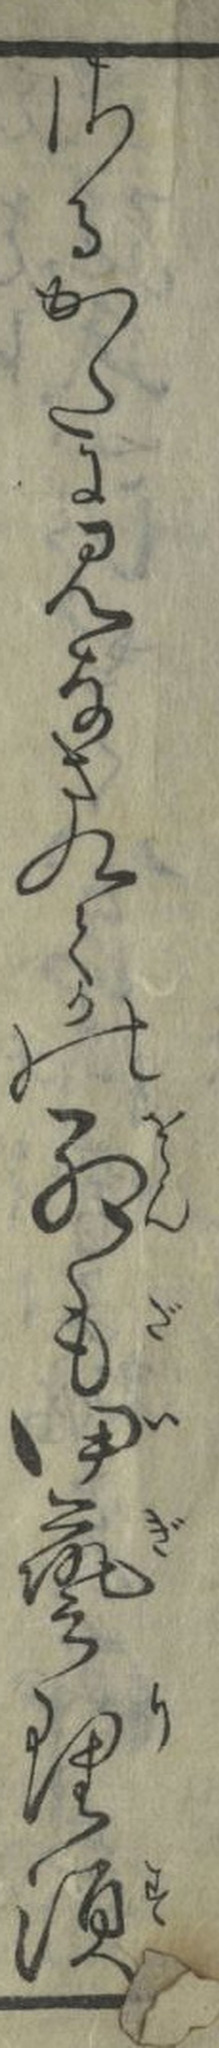さるかたに見なされてかの紅毛伊藝理須
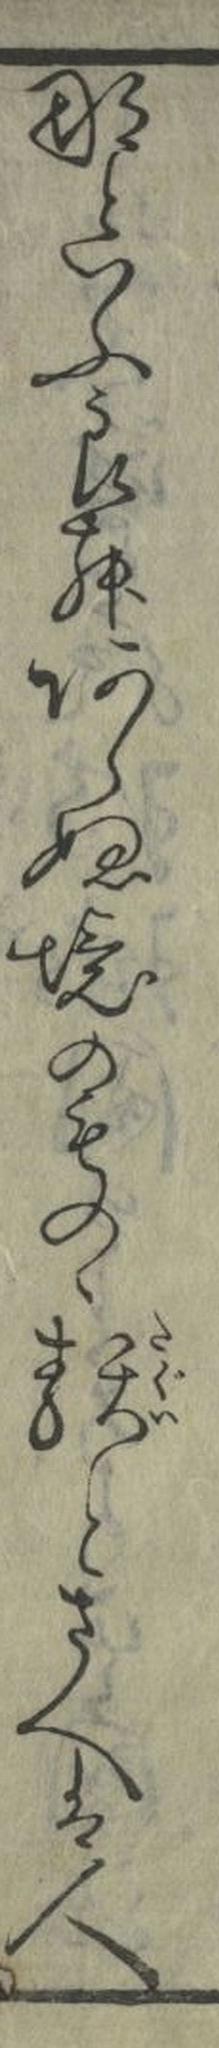なといふらむあらぬ境のものゝ類とさへは人
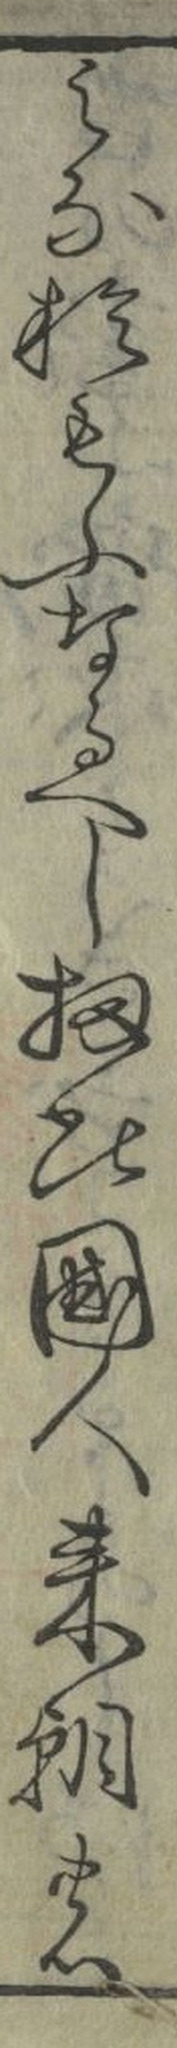みなおもふなるへし扨此國人来朝の
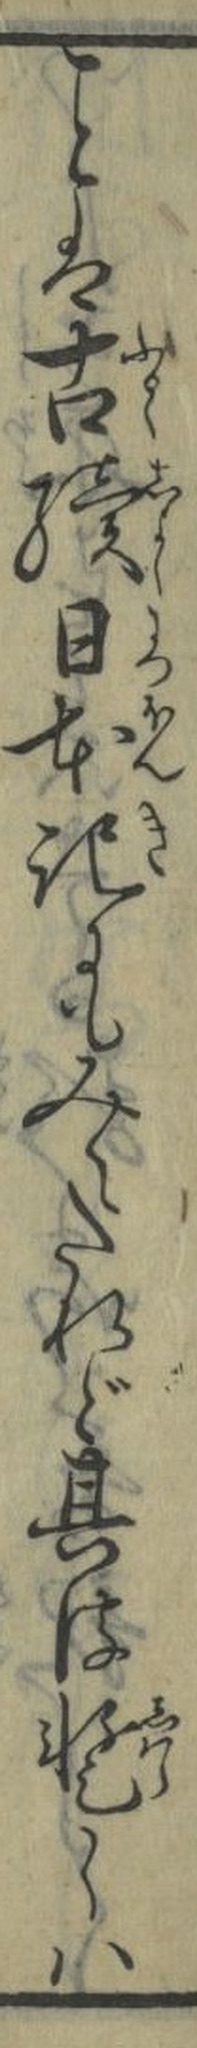ことは古続日本記にもみえたれど其後暫くは
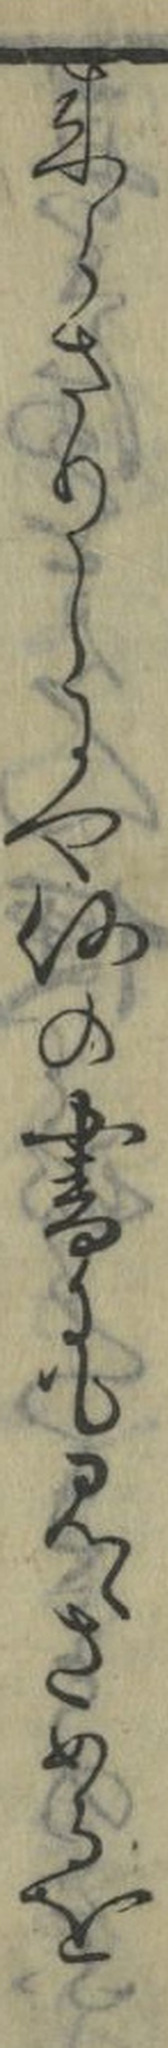来らさりしにや何の書にも見えさめるを
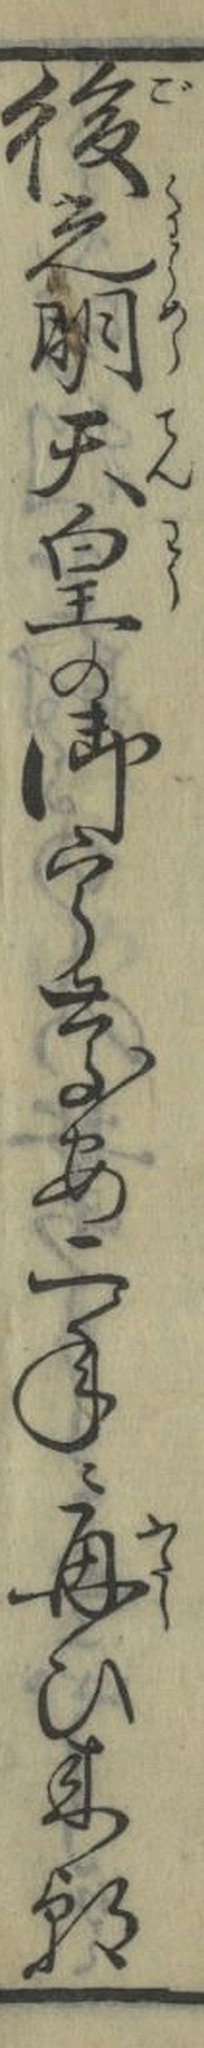後光明天皇の御宇慶安二年に再ひ来朝
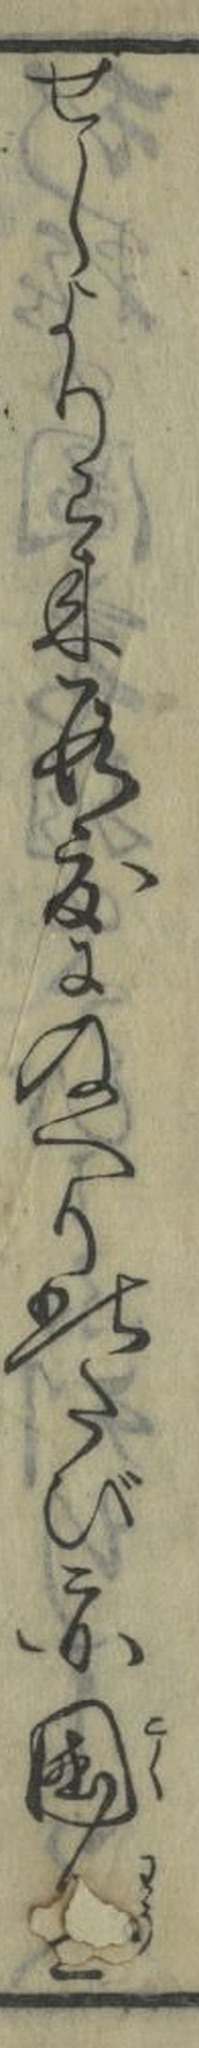せしより已来毎度に及へり此たび亦国王
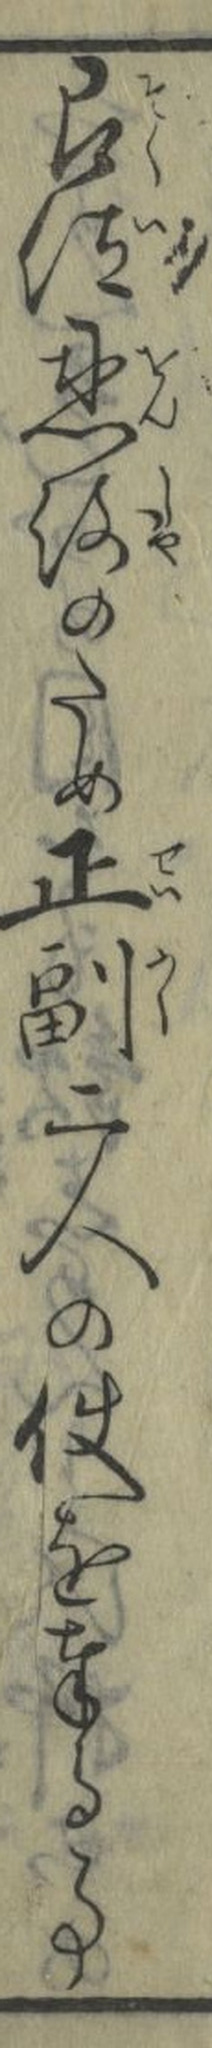即位恩謝のため正副二人の仗を奉る事
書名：[琉球人行列記]
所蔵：University of the Ryukyus Library
